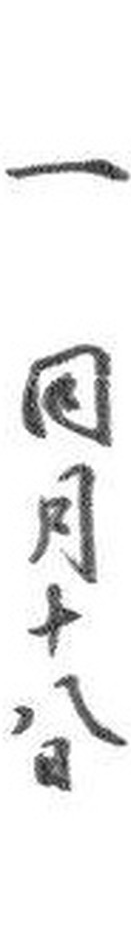一同月十八日
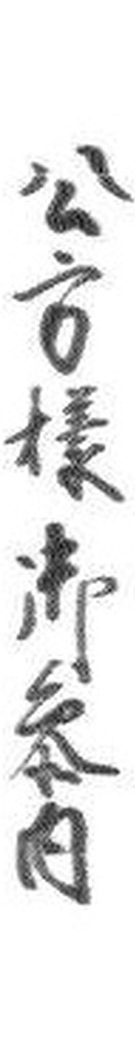公方様御参内
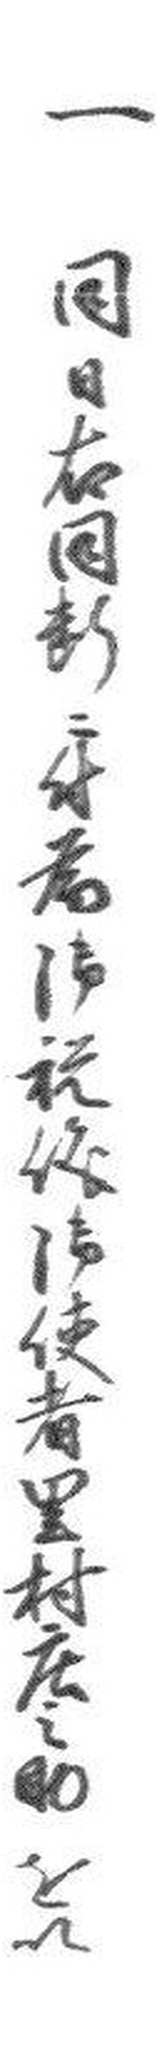一同日右同断ニ付為御祝儀御使者里村庄之助を以

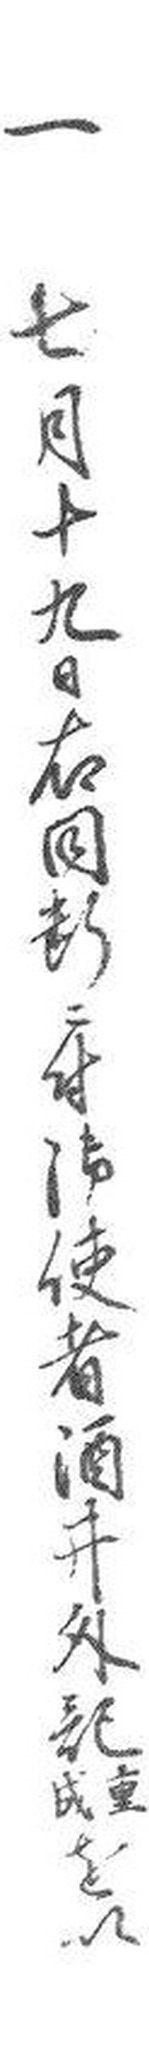一七月十九日右同断ニ付御使者酒井外記重成を以
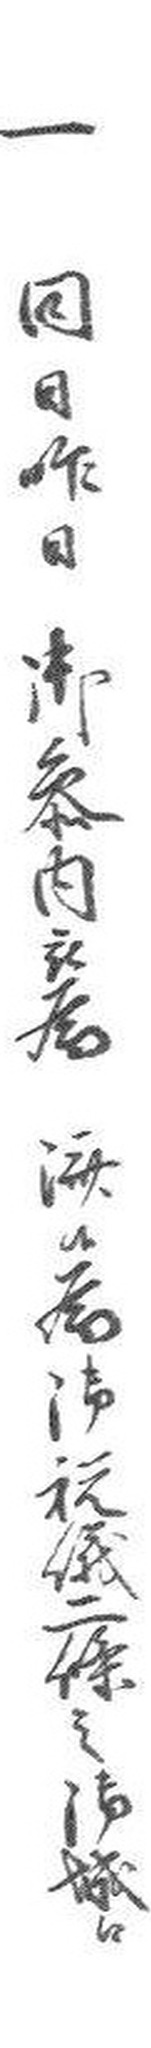一同日昨日御参内被為済候為御祝儀二条之御城江
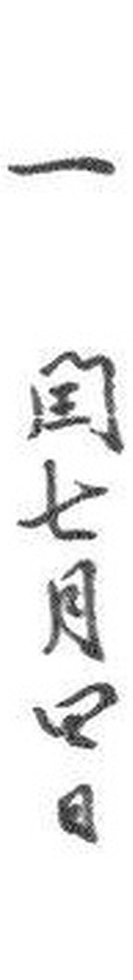一閏七月四日
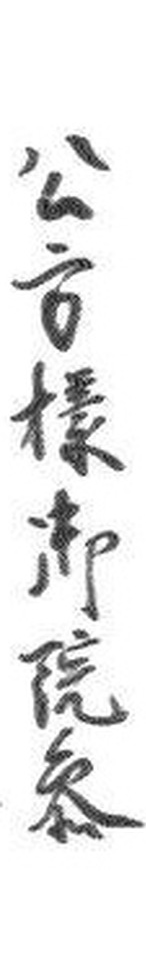公方様御院参
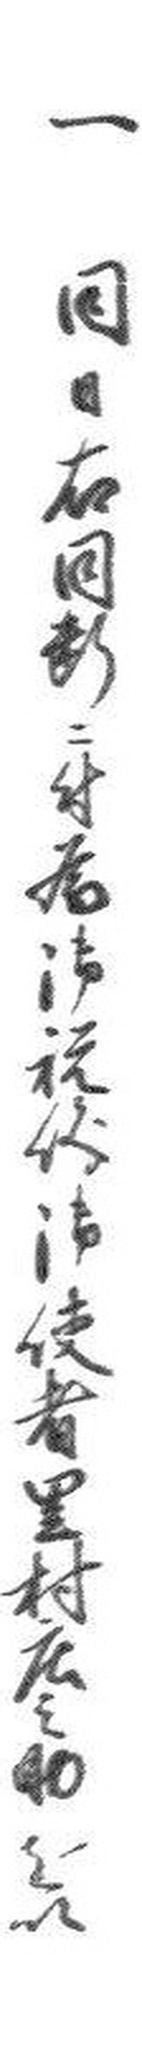一同日右同断ニ付為御祝儀御使者里村庄之助を以
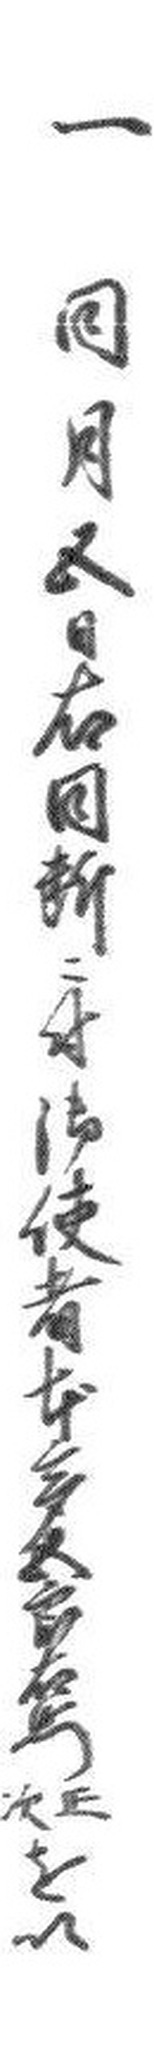一同月五日右同断ニ付御使者本多五郎右衛門正次を以
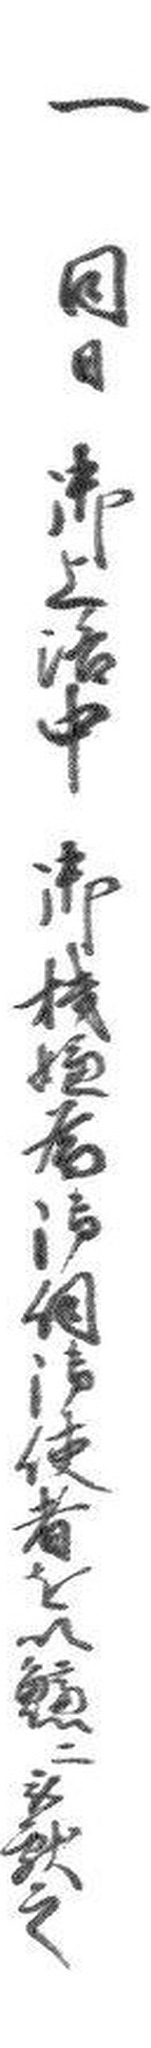一同日御上洛中御機嫌為御伺御使者を以鱸二被献之
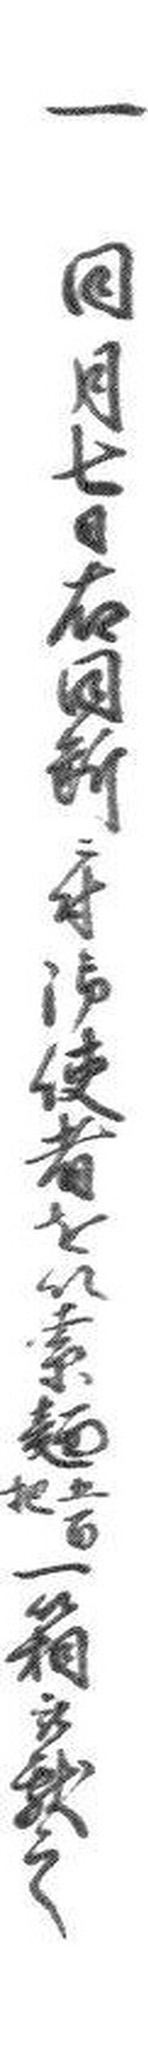一同月七日右同断ニ付御使者を以素麵五百把一箱被献之
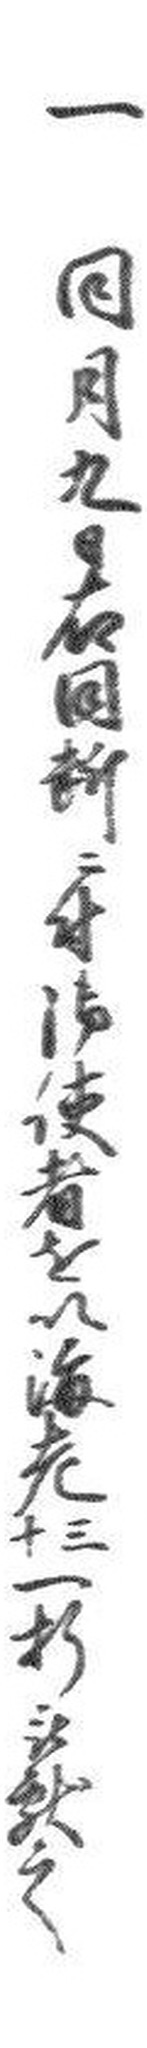一同月九日右同断ニ付御使者を以海老三十一折被献之

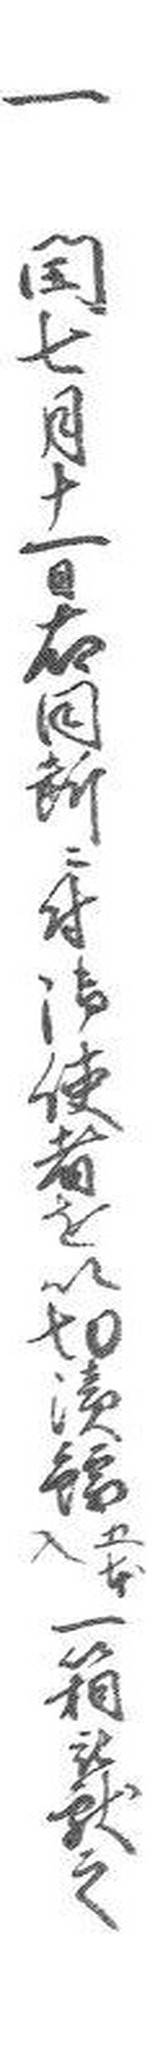一閏七月十一日右同断ニ付御使者を以切漬鱈五本入一箱被献之
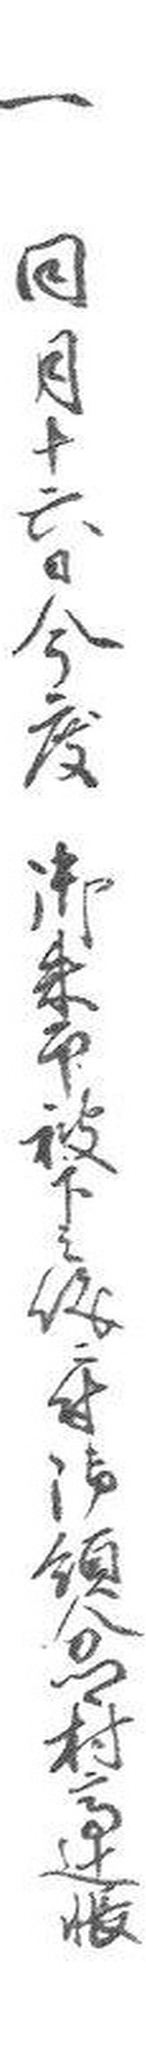一同月十六日今度御朱印被下之儀ニ付御領分郷村高辻帳
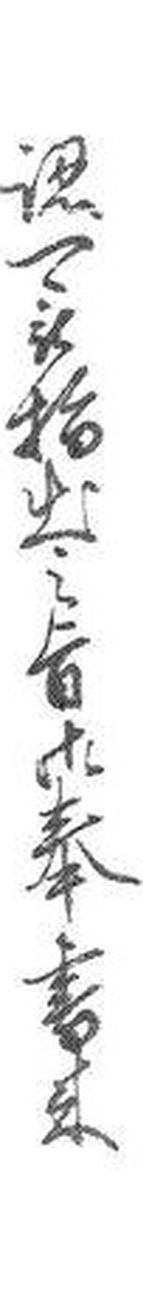認可被指出之旨御奉書来
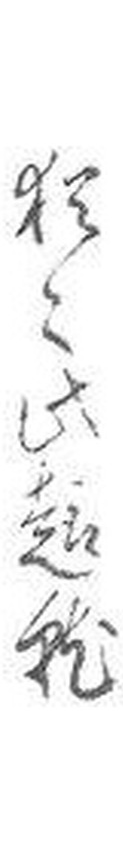猶々此趣就
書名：家譜 四 忠昌公 従寛永七年到正保四年
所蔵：福井県文書館 Fukui Prefectural Archives
